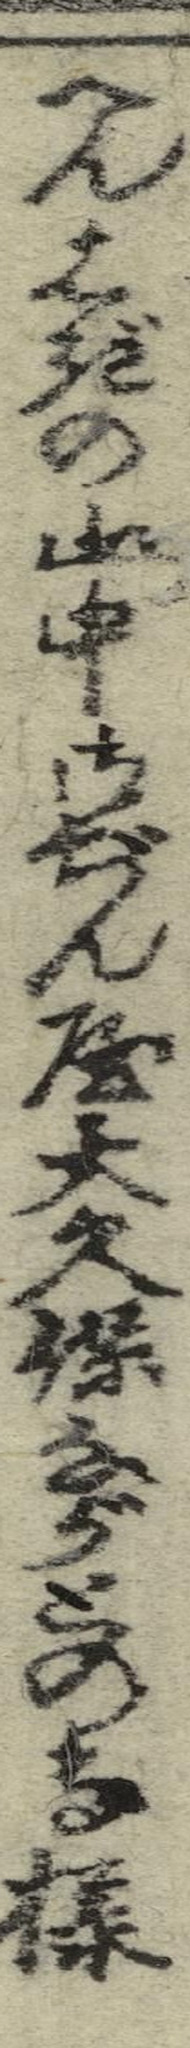へんはぎの山中御ぢん屋大久保ながとの守様
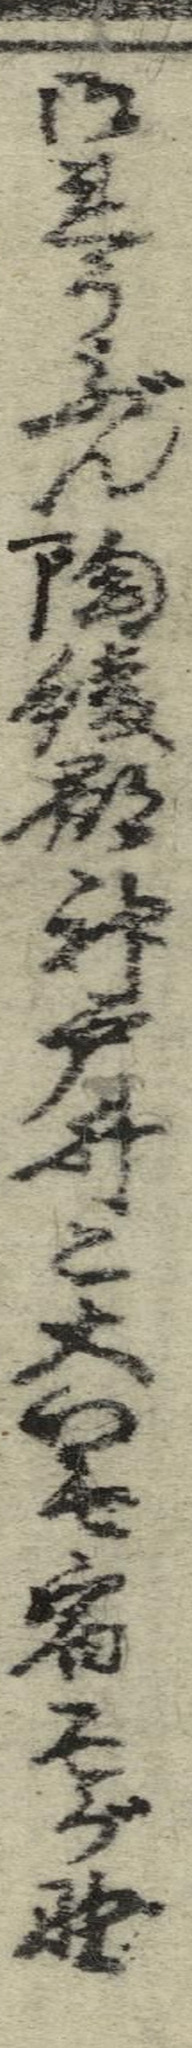御れうぶん陶綾郡神戸升こ大いそ宿そが野
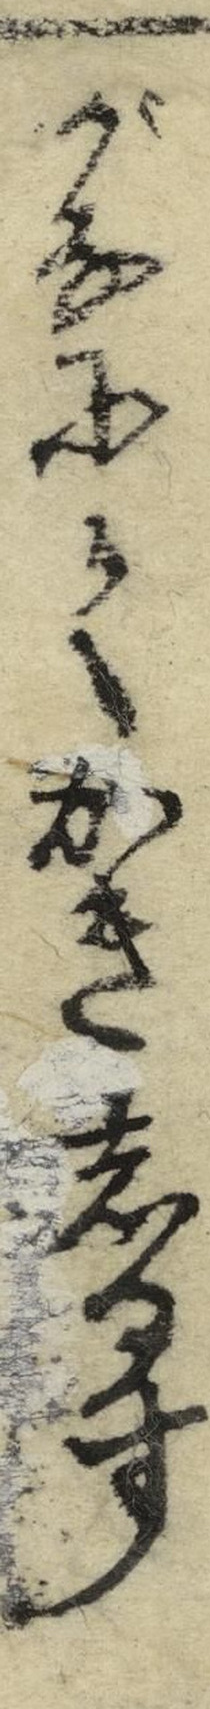がなにてかきしるす
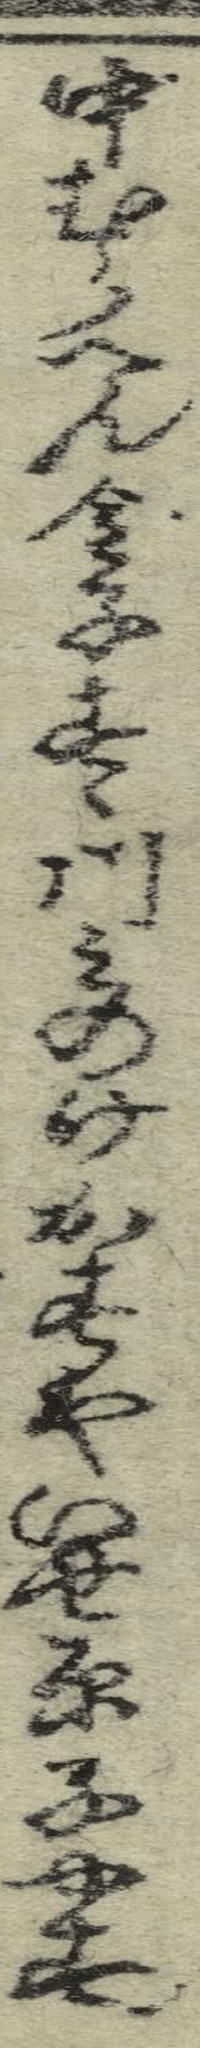中むらへん金子すゝ川みのけかすやいせ原子やす
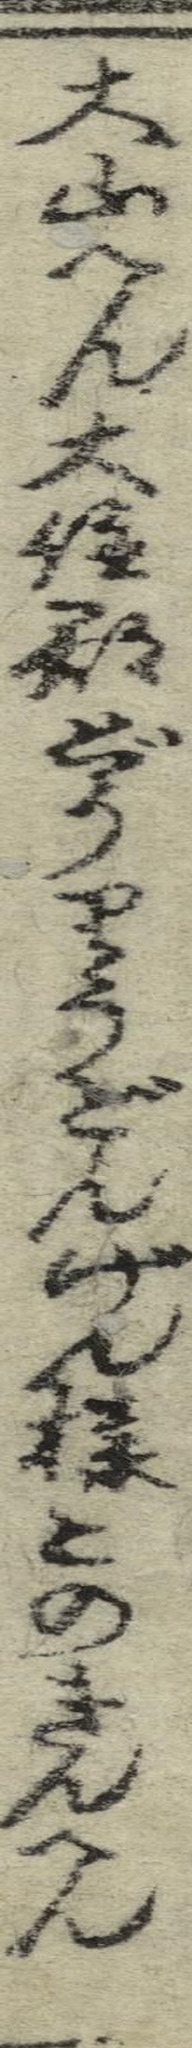大山へん大住郡どうりうごんげん様このきんへん
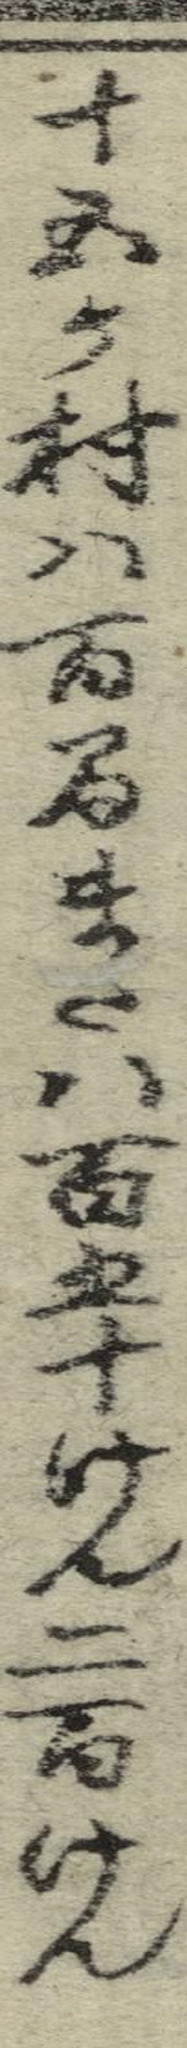十五ヶ村は百間または百五十けん二百けん
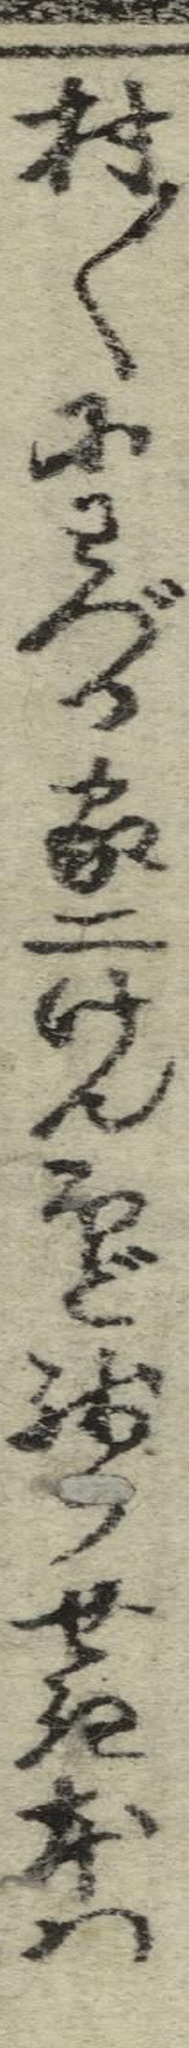村々にわづか家二けんほど残りせき本は
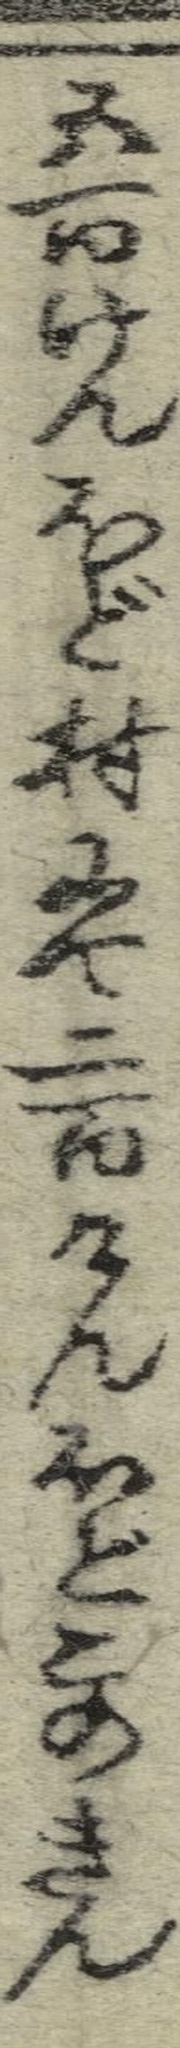五百けんほど村にて二百けんほとこのきん
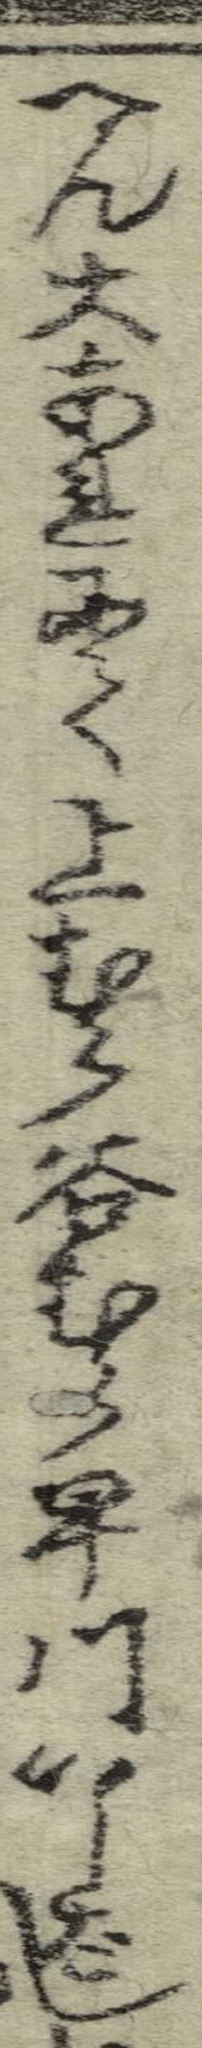へん大あれにて上むら谷むら早川いしばし山
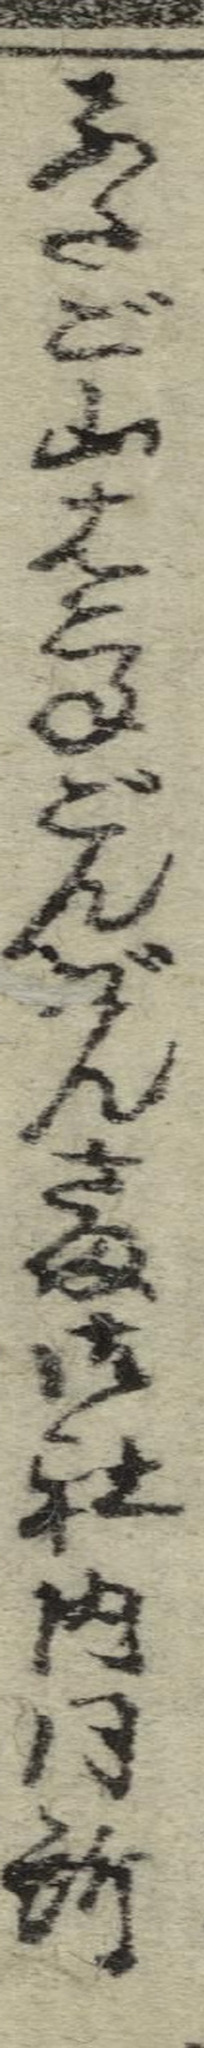あたご山はこるごんげんさま御社内同所
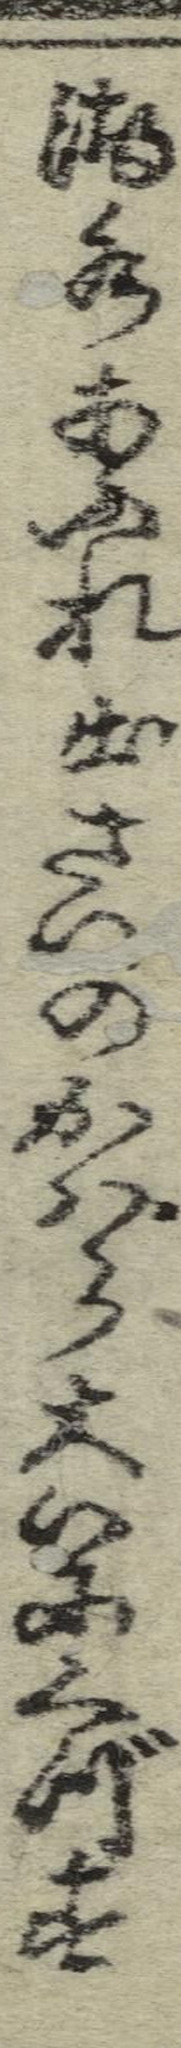湖水あふれ出さいのかはら大いにくずれ
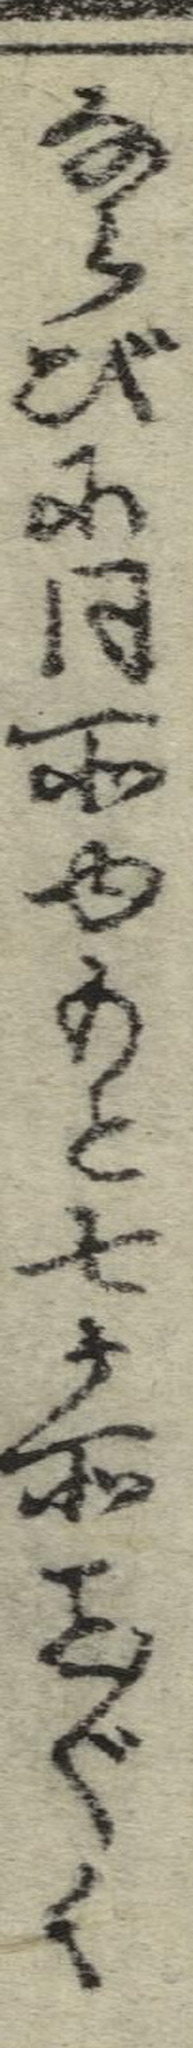ならびに同所ゆもと七ヶ所こと〴〵く
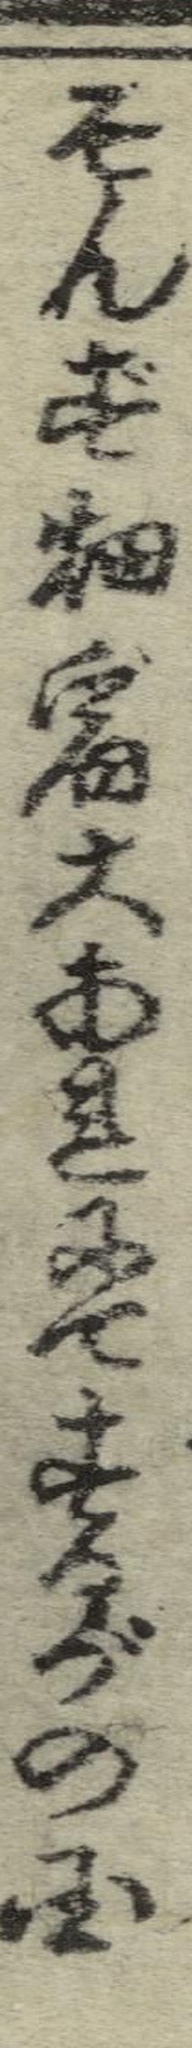そんず畑宿大あれにてするがの国
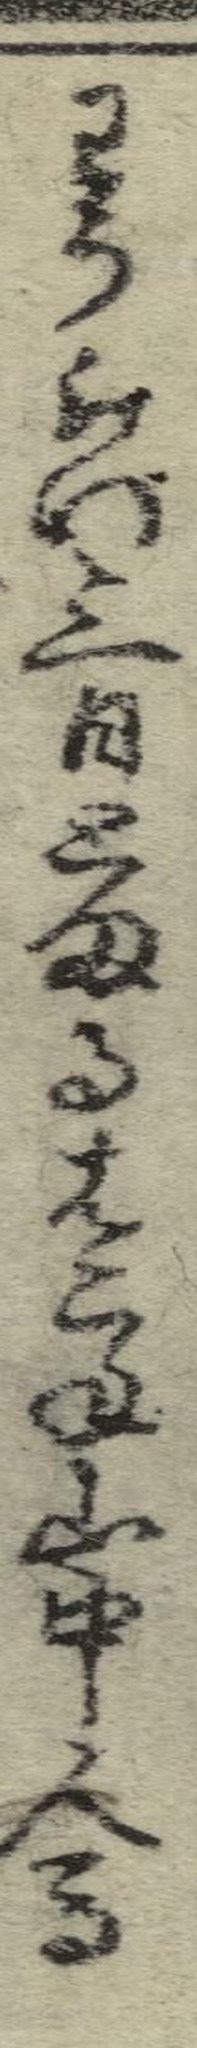わうらい三日とまるはこね山中人馬
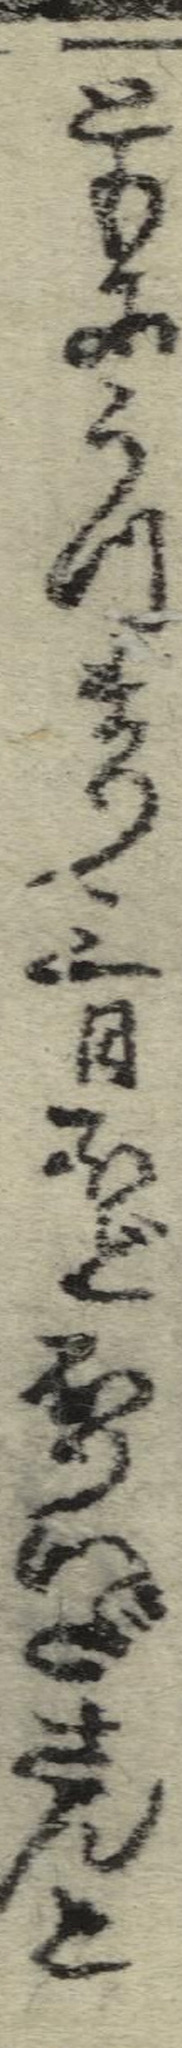ともにうつまり三日ほどほりいださんと
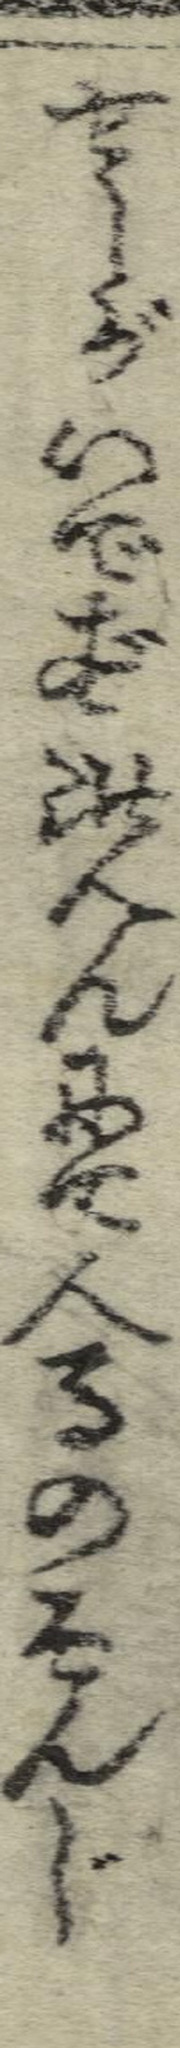せしがいでず此へんにて人馬のそんじ
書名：伊豆下田・小田原・箱根　大地震之圖
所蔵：東京大学地震研究所図書室 Earthquake Research Institute Library, The University of Tokyo, JAPAN
